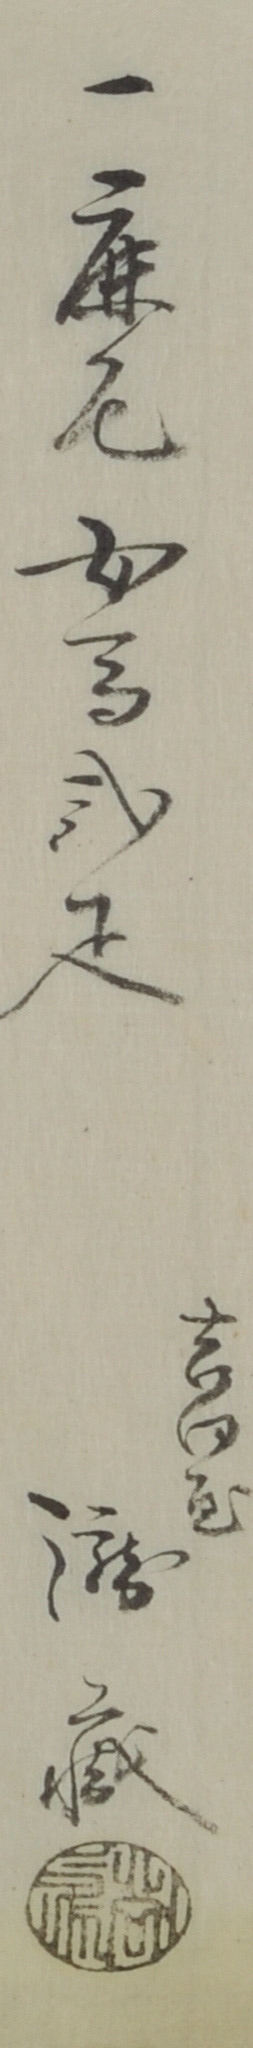一鹿毛女馬弐疋瀧蔵㊞
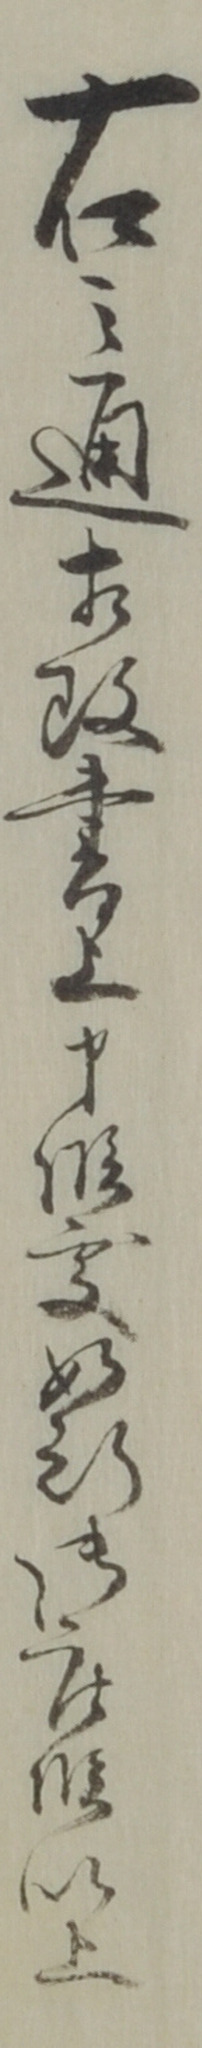右之通相改書上申候処如斯御座候以上
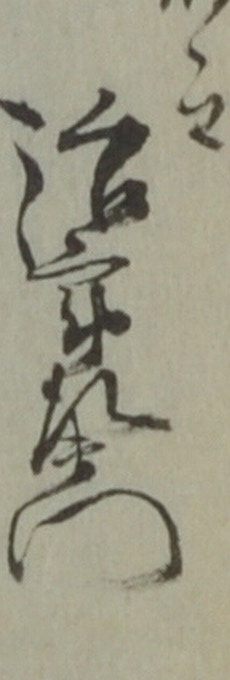治郎左衛門
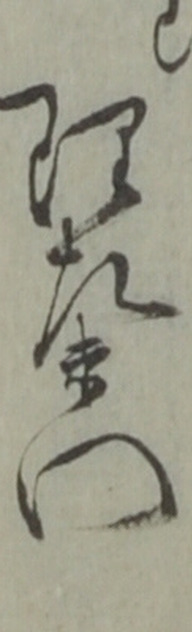治郎左衛門
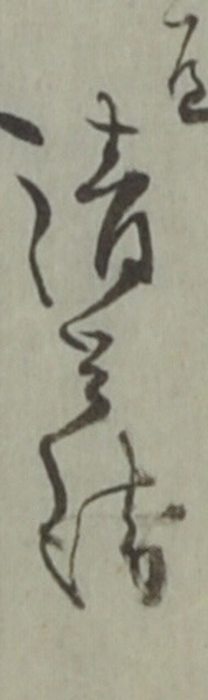清兵衛
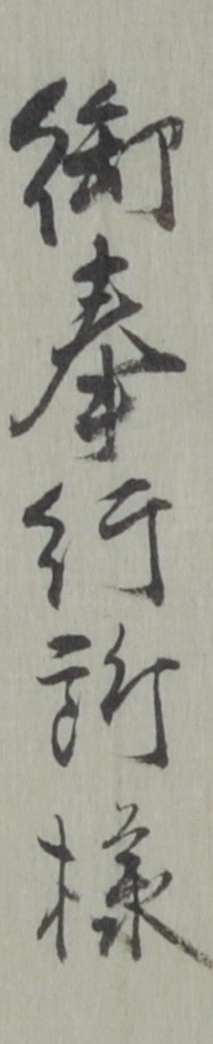御奉行所様

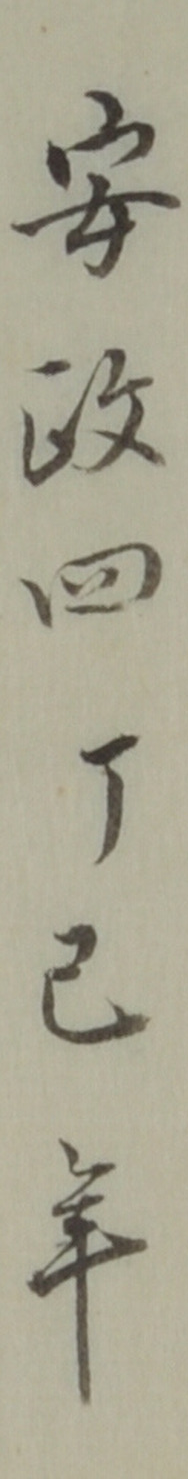安政四丁巳年
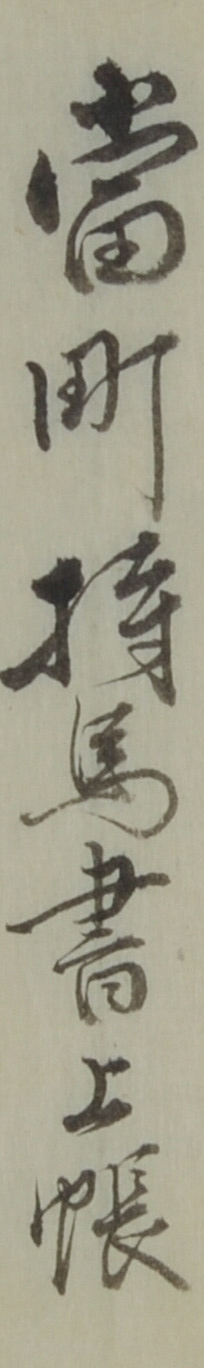当町持馬書上帳

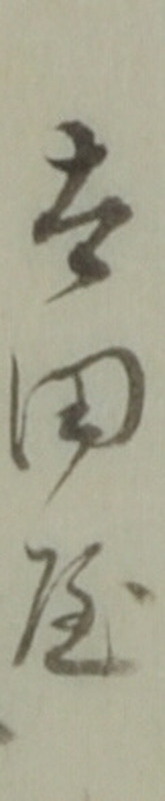太田屋
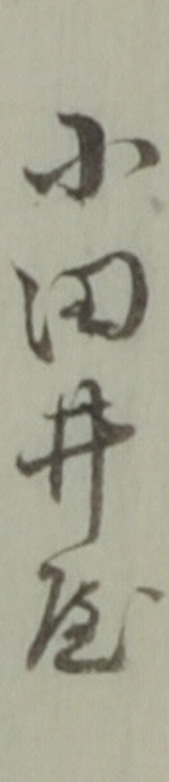小田井屋

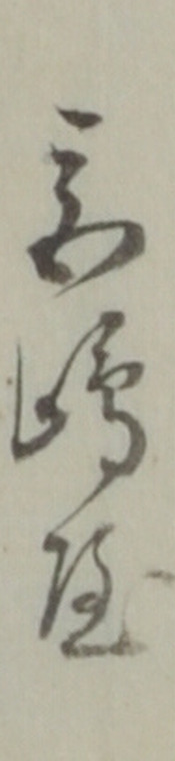宮嶋屋
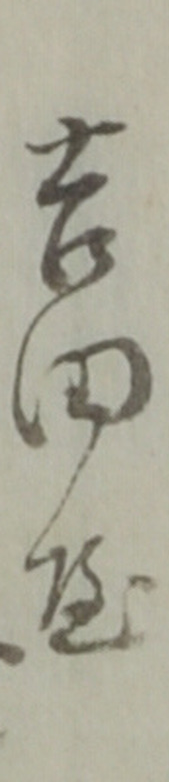吉田屋
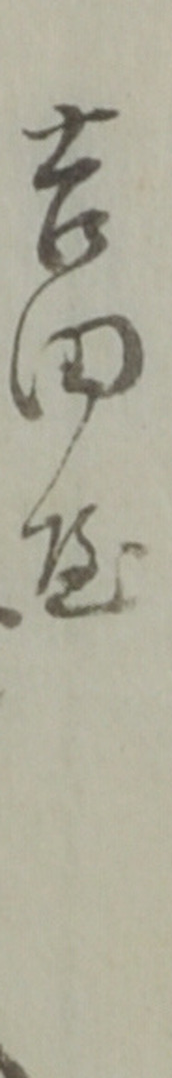吉田屋
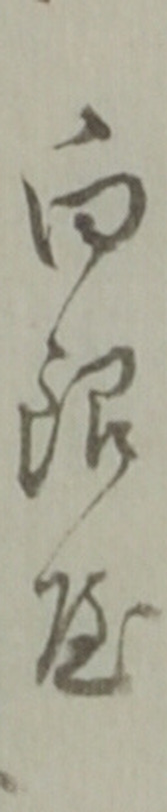白銀屋
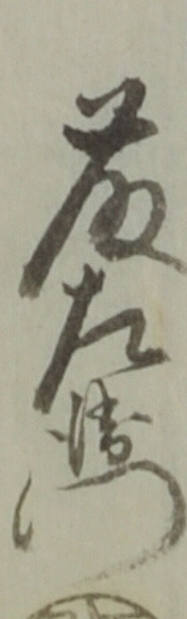理左衛門
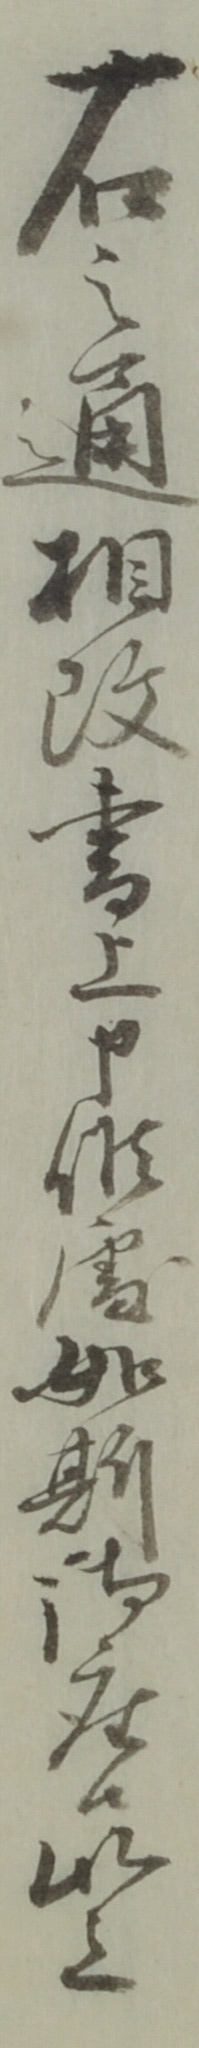右之通相改書上申候処如斯御座候以上
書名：當町持馬書上帳
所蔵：伊那市立高遠町図書館・合同会社AMANE
